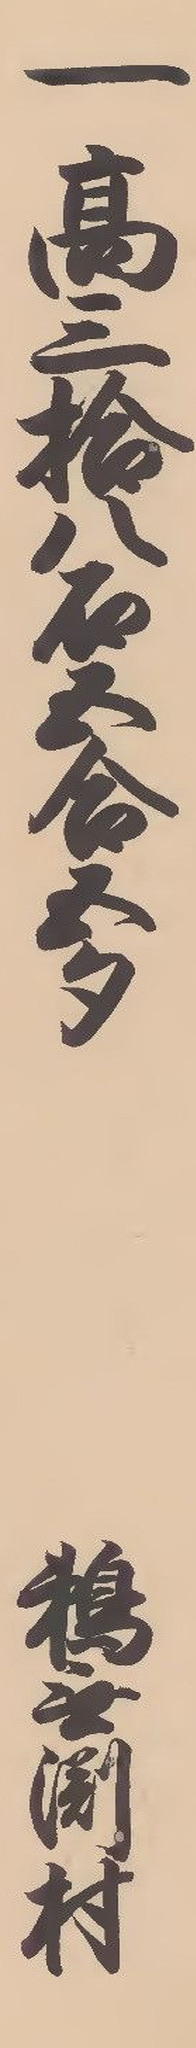一高三拾八石五合五勺鵜無渕村
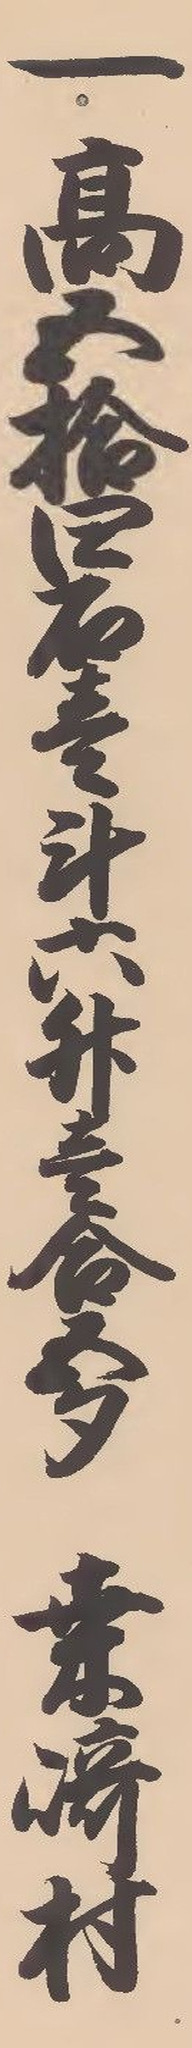一高五拾四石壱斗六升壱合五勺桑崎村
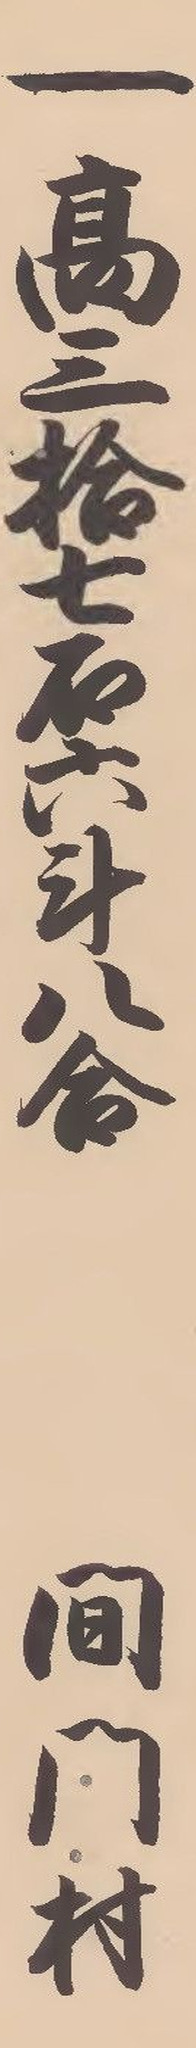一高三拾七石六斗八合間門村
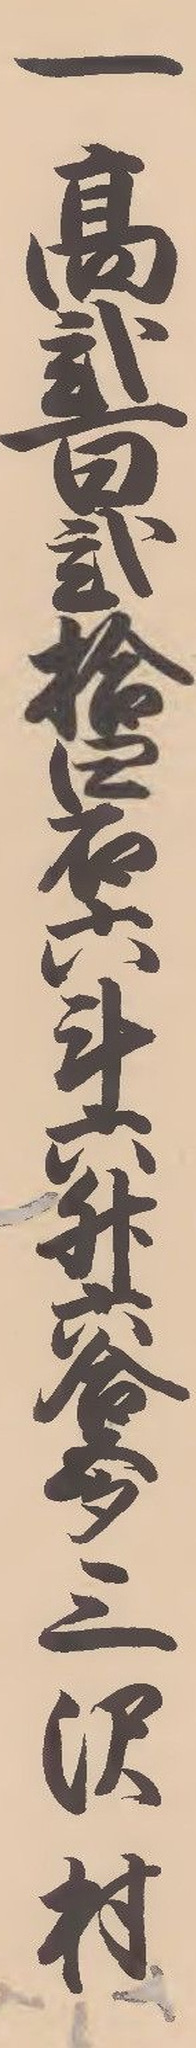一高弐百弐拾四石六斗六升六合五勺三沢村
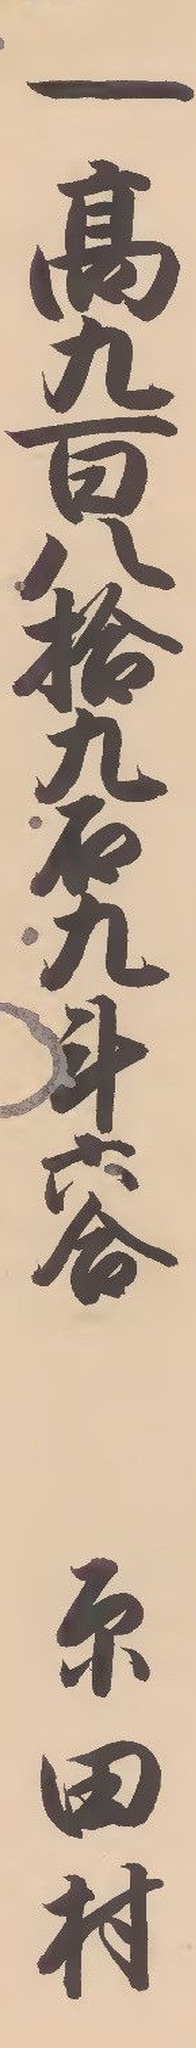一高九百八拾九石九斗六合原田村

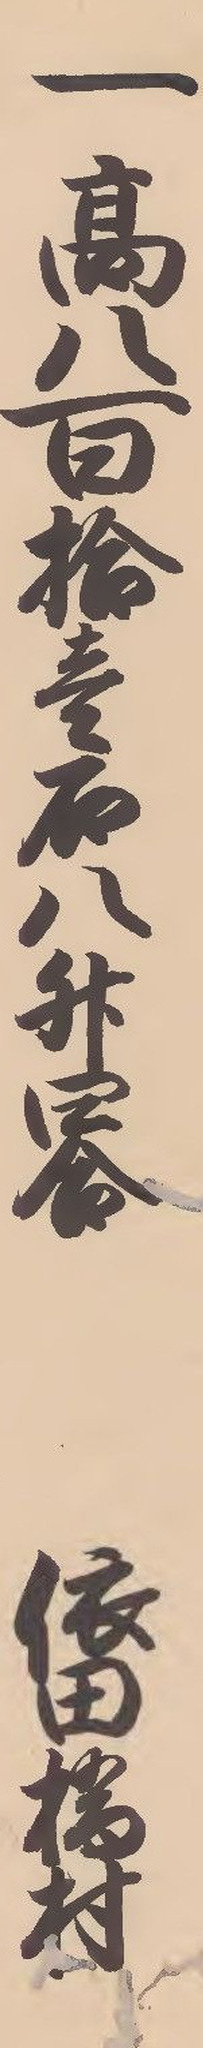一高八百拾壱石八升四合依田橋付
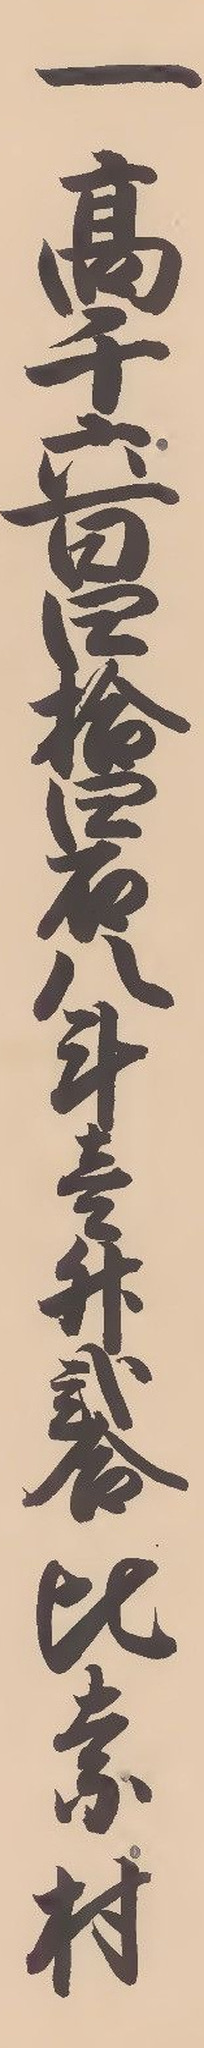一高千六百四拾四石八斗壱升弐合比奈村
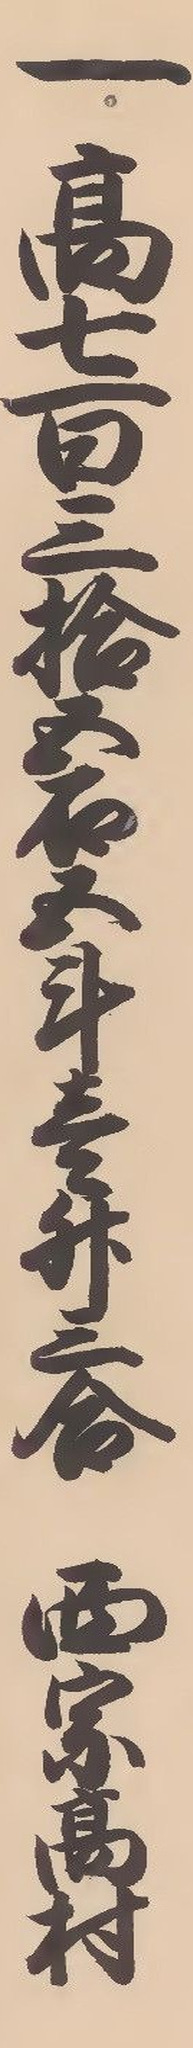一高七百三拾五石五斗壱升三合西宗高村
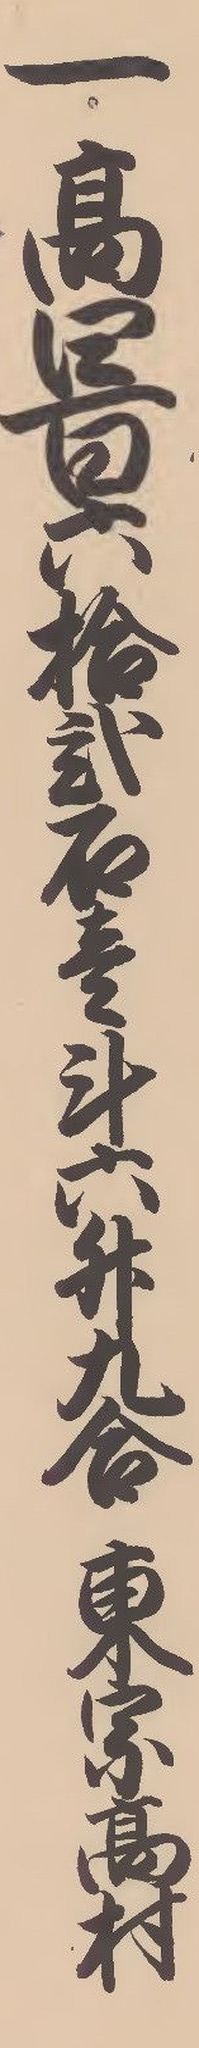一高四百六拾弐石壱斗六升九合東宗高村
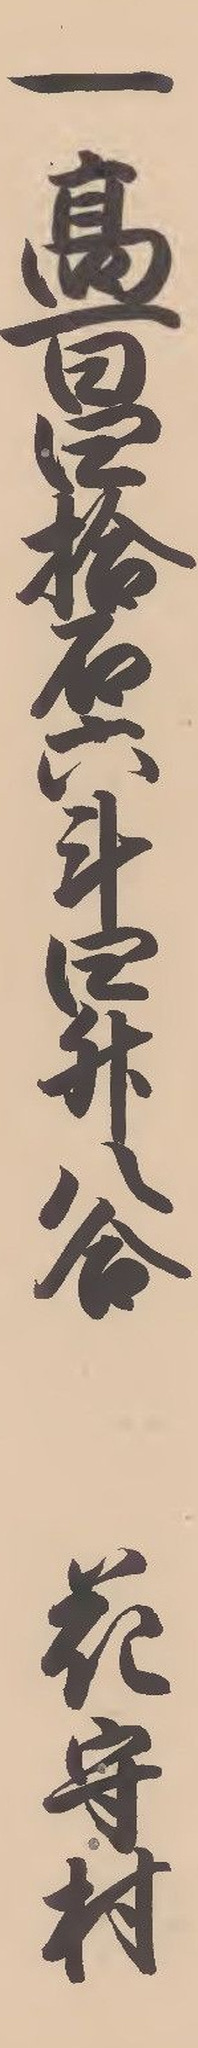一高百四拾石六斗四升八合花守村
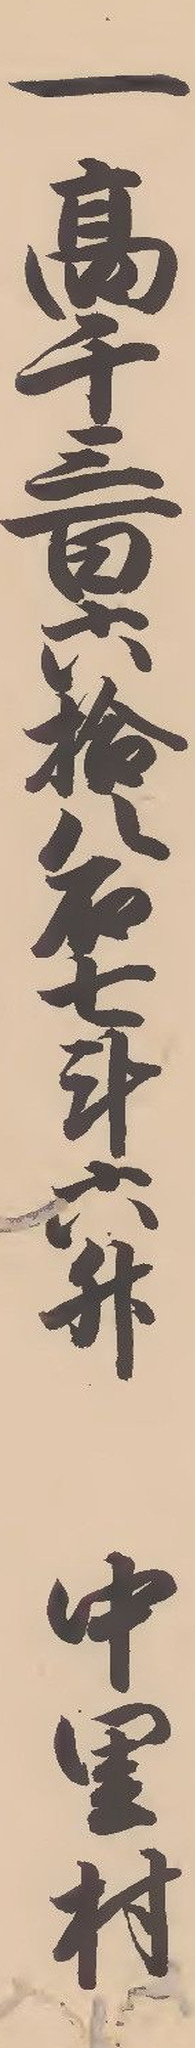一高千三百六拾八石七斗六升中里村
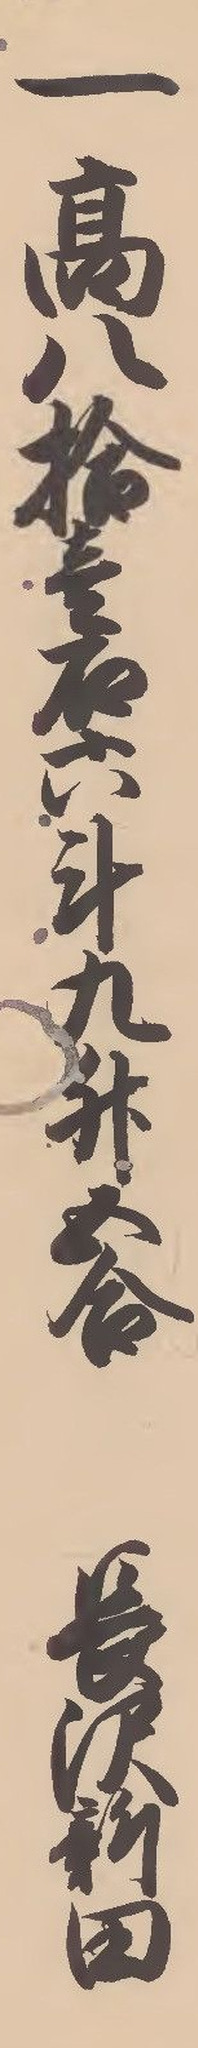一高八拾壱石六斗九升五合長沢新田

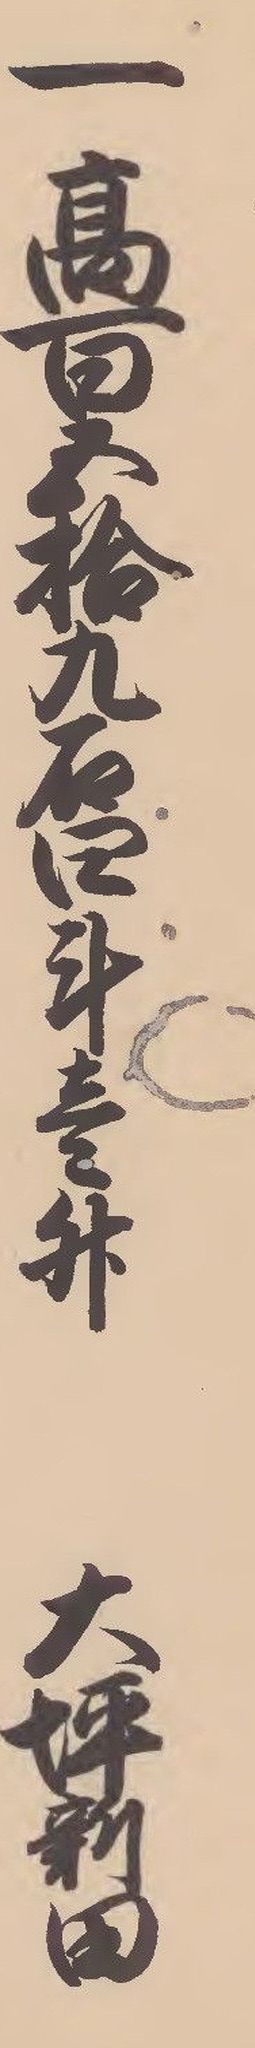一高百五拾九石四斗壱升大坪新田
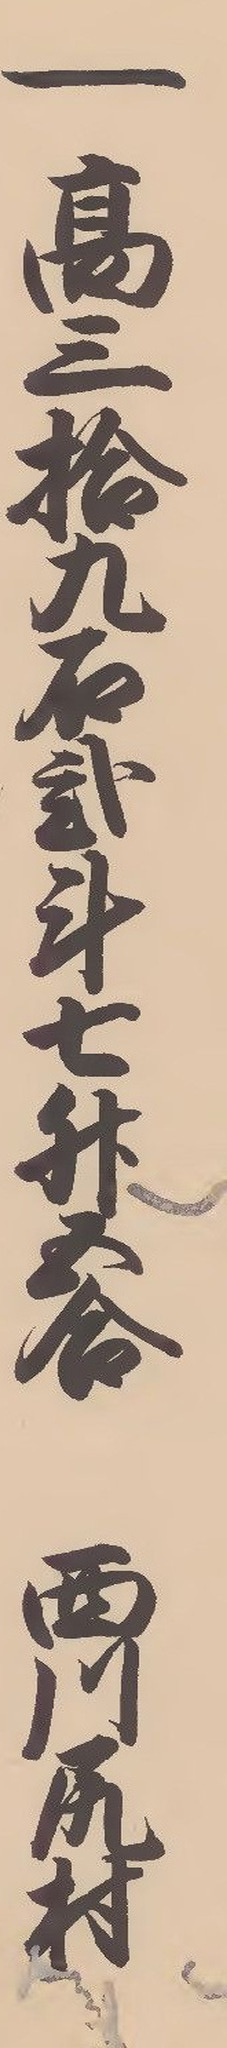一高三拾九石弐斗七升五合西川尻村
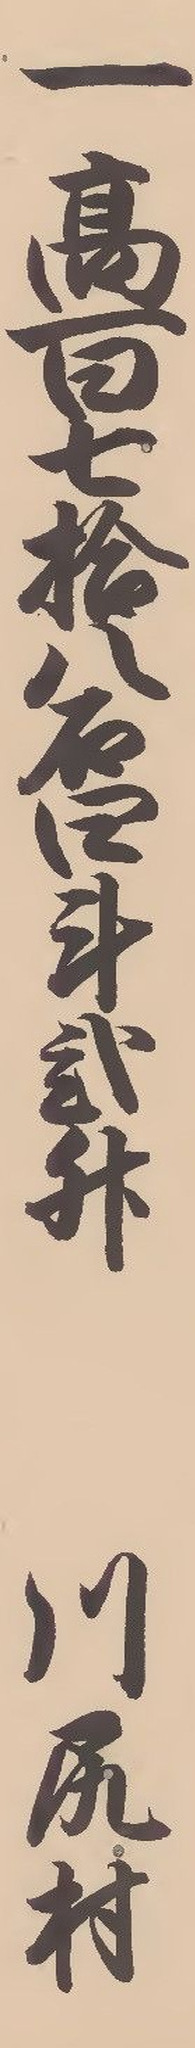一高百七拾八石四斗弐升川尻村
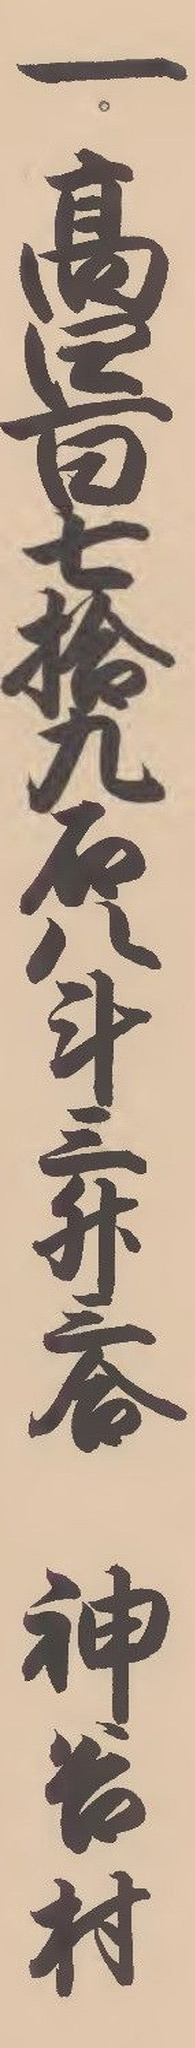一高四百七拾九石八斗三升三合神谷村
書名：駿河国郷帳
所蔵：国立公文書館 National Archives of Japan
